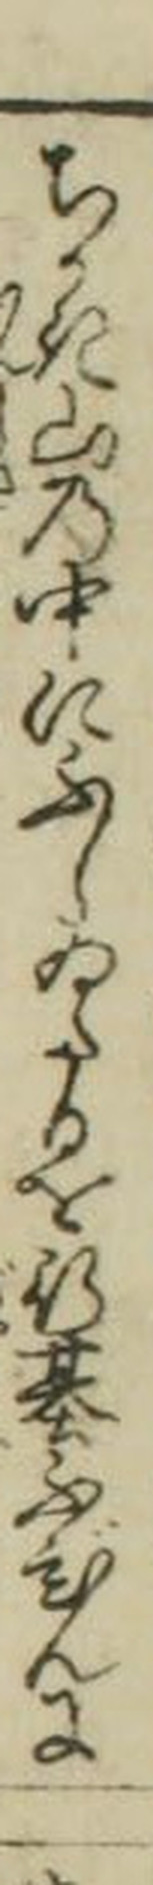ちかき山の中にふしゐたるを行基ふびんに
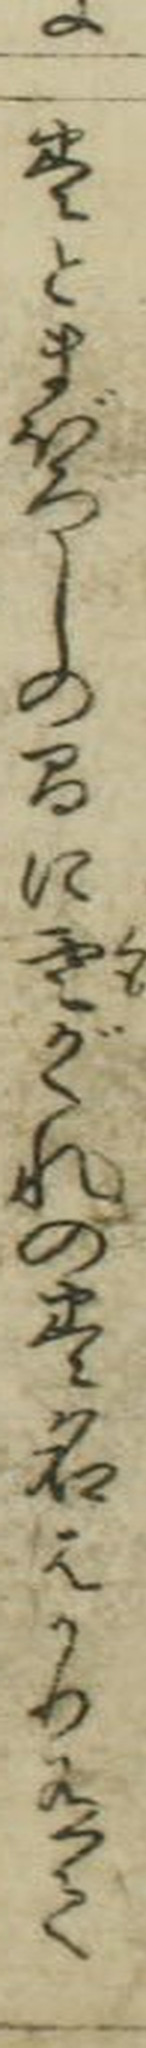巻とまぼろしの間に雲がくれの巻名はかり有て
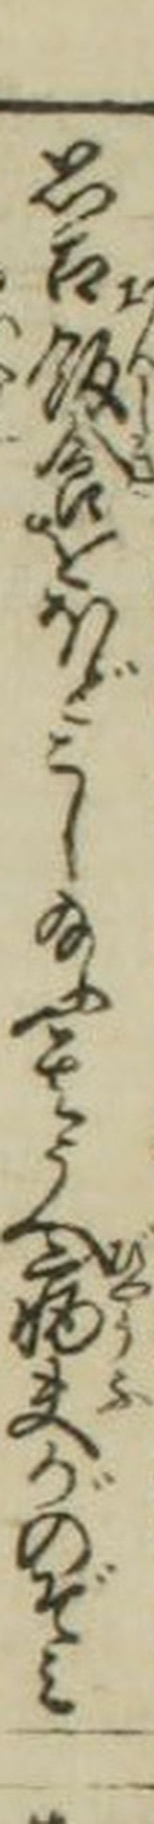思召飯食をほどこし給ふ其うへ病夫がのぞみ
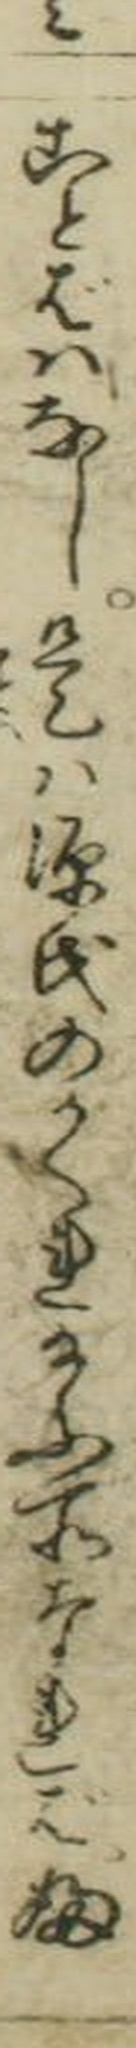ことばはなし。是は源氏のかくれ給ふ所なれば。ふ
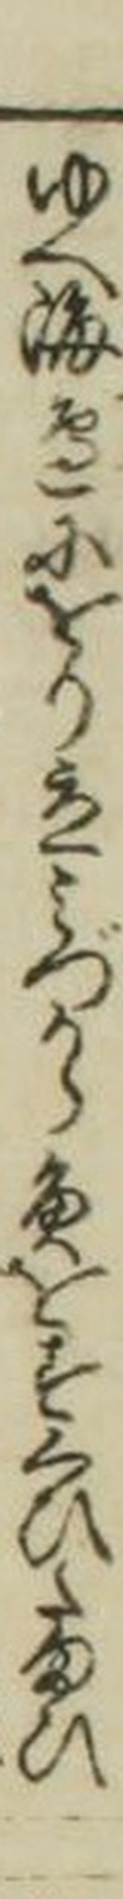ゆへ海辺にをり立みづから魚をすくひたまひ
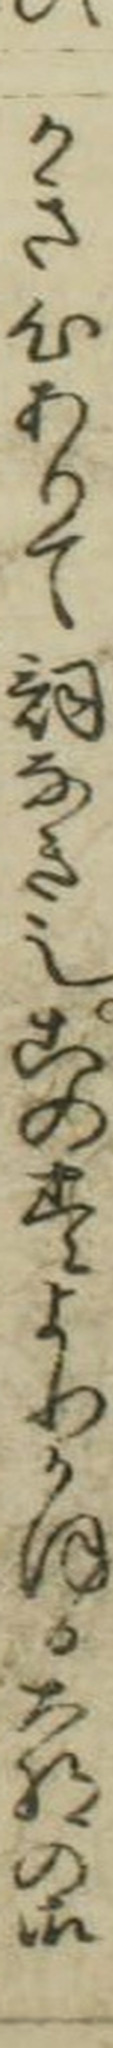かき心ありて詞なき也。この巻よりかほる大将の御
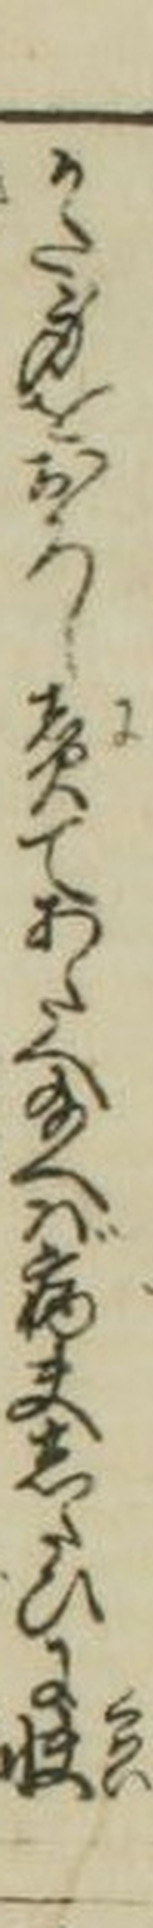かた身をおろし煮てあたへ給へば病夫したひに快
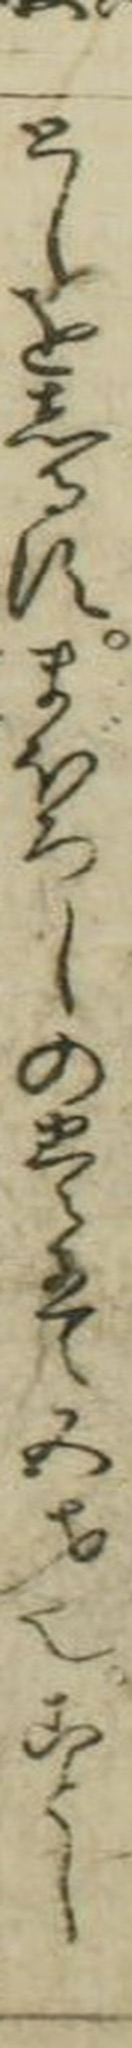としをしるす。まぼろしの巻にて五才也。ことし
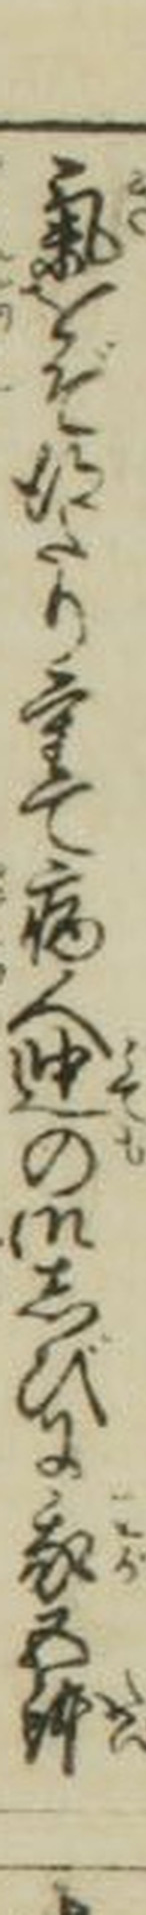気をぞ得たり重て病人迚の御しびに我五体
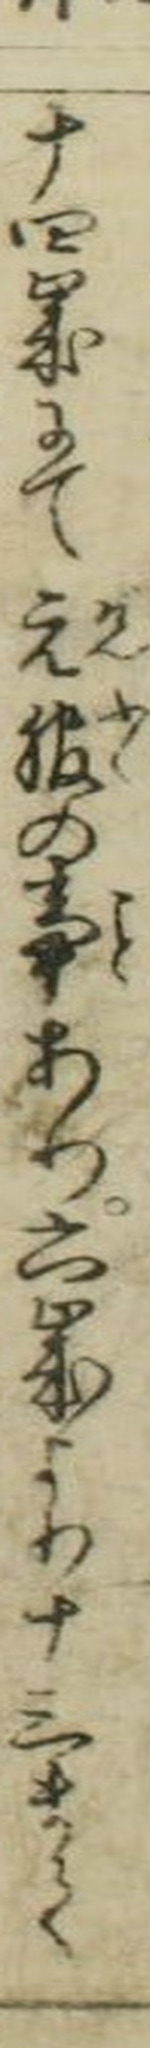十四歳にて元服の事あり。六歳より十三まて
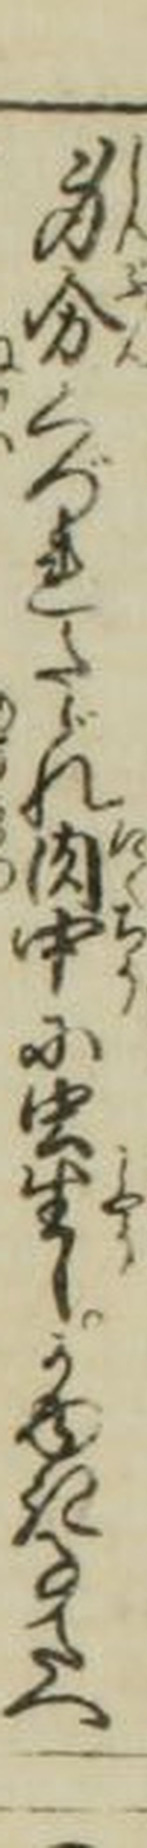身分くづれたゞれ肉中に虫生し。かゆき事たへ
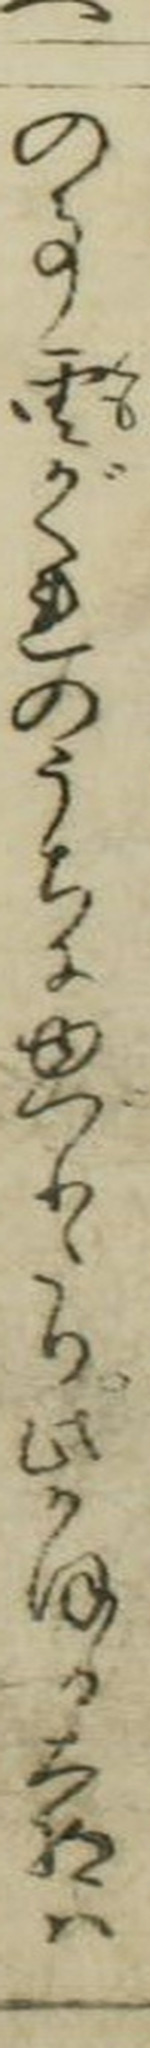の事雲がくれのうちにゆづりたり。此かほる大将は
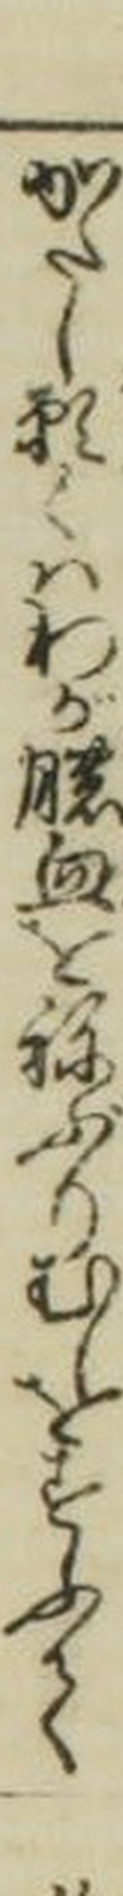がたし願くはわが膿血をねぶりむしをすふて
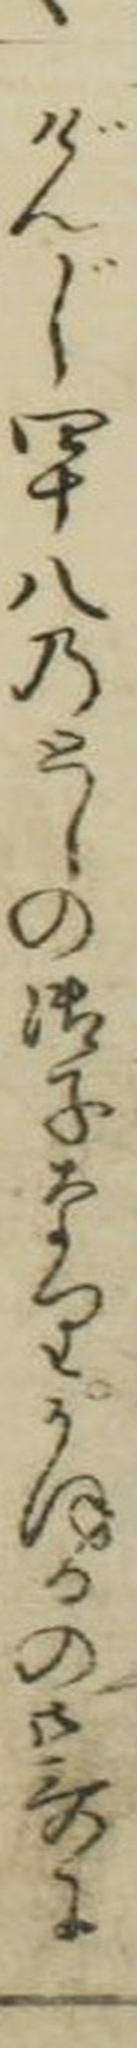げんじ四十八のとしの御子なり。かほるの御哥に
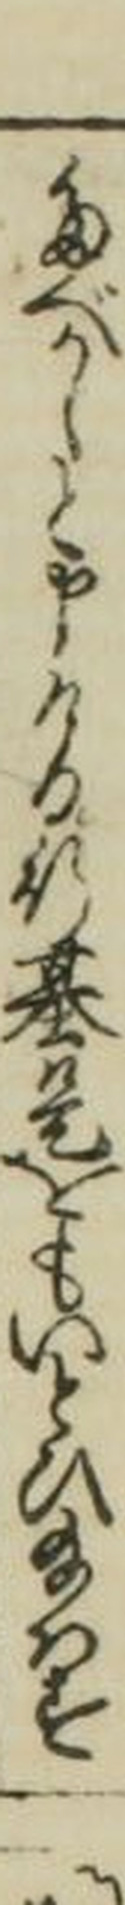たべかしと申ける。行基是をもいとひ給はす
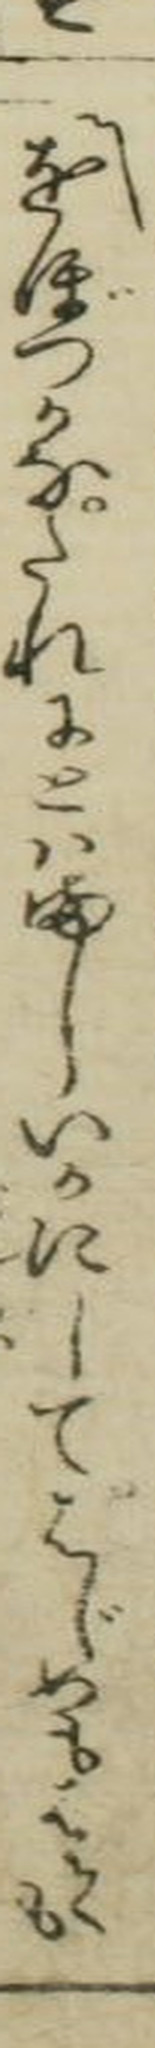〽をぼつかな。たれにとはましいかにして。はじめもはても
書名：女源氏教訓鑑
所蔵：東京学芸大学附属図書館
